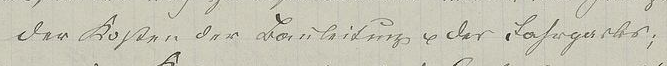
der Kosten der Bauleitung u. des Fahrparks;
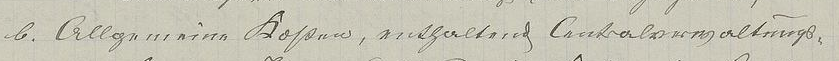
b. Allgemeine Kosten, enthaltend Centralverwaltungs-
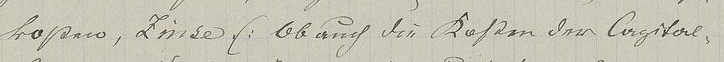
kosten, Zinse (Ob auch die Kosten der Capital-
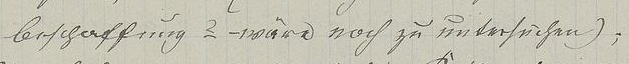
beschaffung? – wäre noch zu untersuchen);
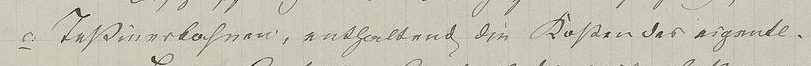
c. Teßinerbahnen, enthaltend die Kosten des eigentl.
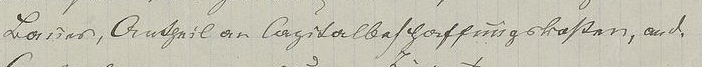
Baues, Antheil an Capitalbeschaffungskosten, an d.
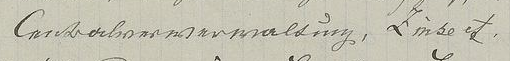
Centralververwaltung, Zinse etc.
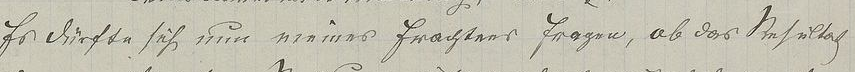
Es dürfte sich nun meines Erachtens fragen, ob das Resultat
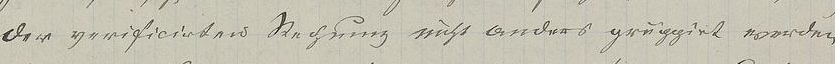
der verificirten Rechnung nicht anders gruppirt werden
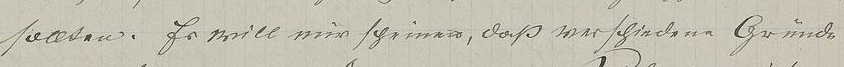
sollten. Es will mir scheinen, daß verschiedene Gründe
